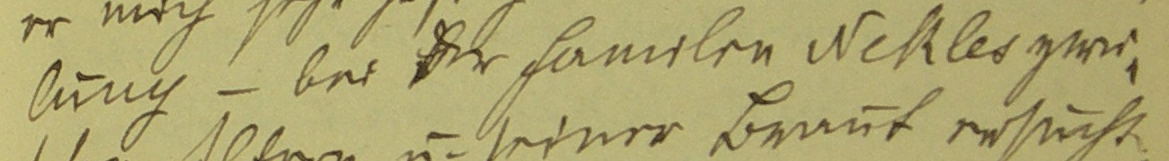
lung – bei der Familie Nekles zwi¬
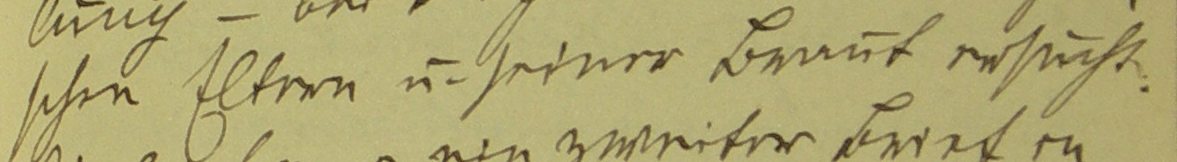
schen Eltern und seiner Braut ersuchte.
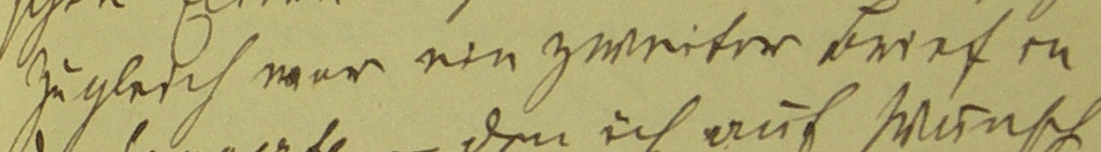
Zugleich war ein zweiter Brief in
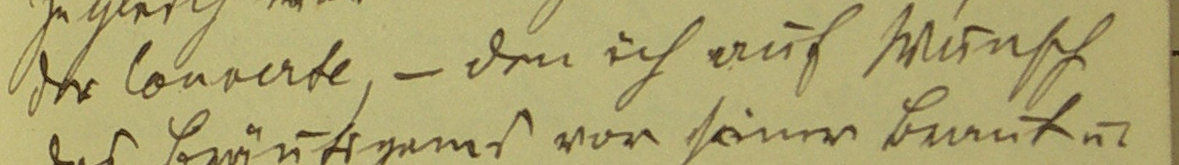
der Couverte, - den ich auf Wunsch
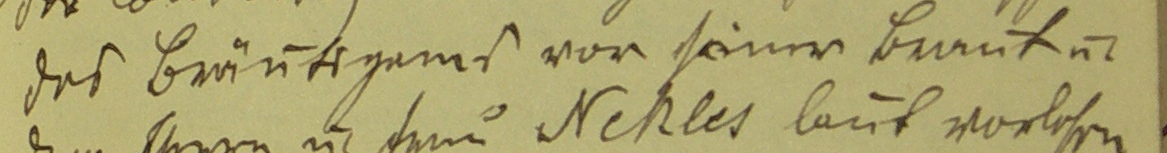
des Bräutigams vor seiner Braut und
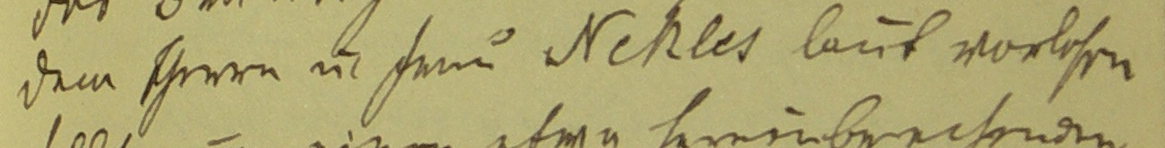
dem Herrn und Frau Nekles laut vorlesen
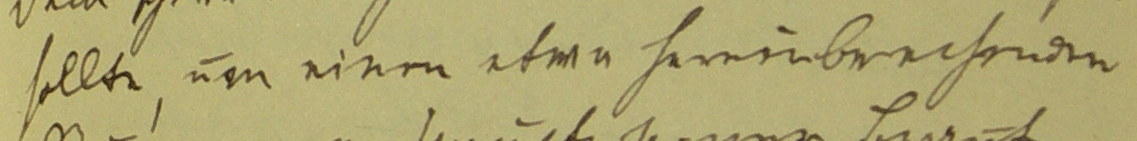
sollte, um einen etwa herübereisenden
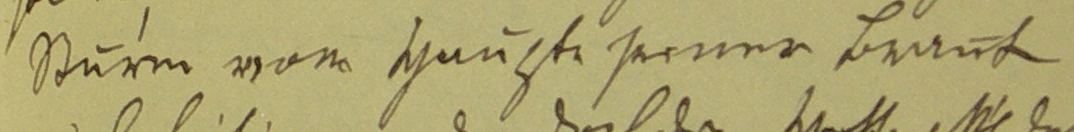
Sturm vom haupt seiner Braut
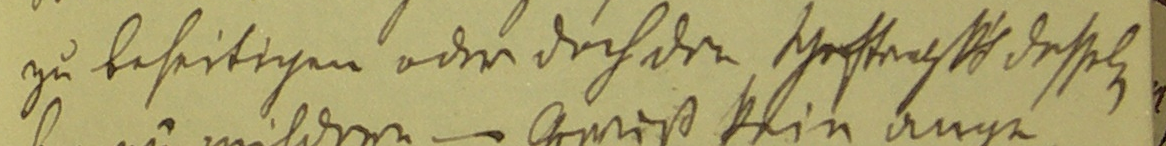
zu beseitigen odr doch den Haupttheil dessel¬
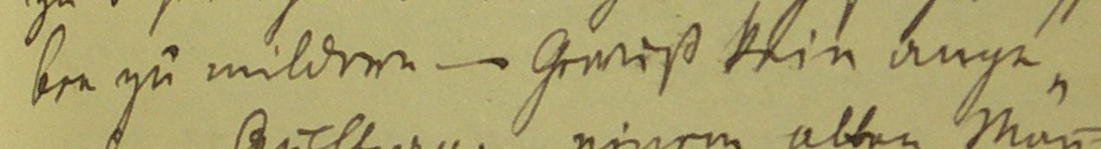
ben zu mildern – Gewiß kein Ang¬
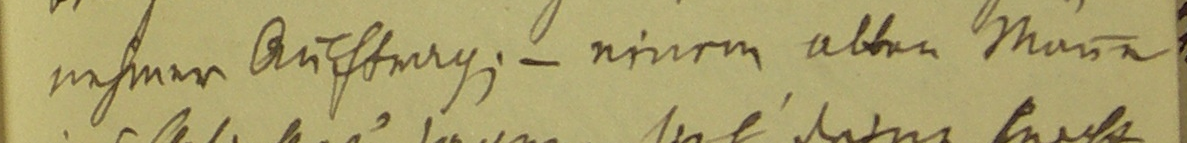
nehmer Auftrag, - einem alten Mann
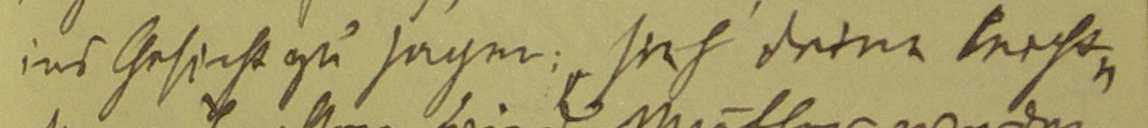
ins Gesicht zu sagen:“Sieh deine leicht¬
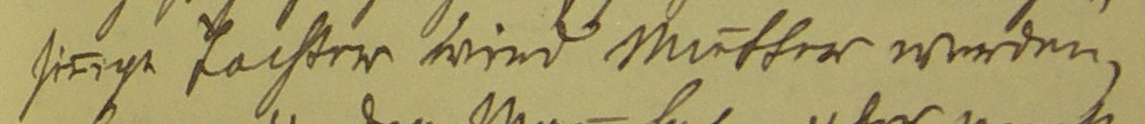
fertige Tochter wird Mutter werden
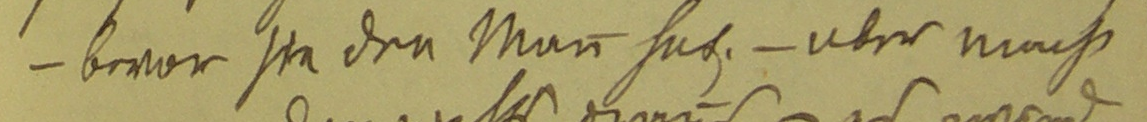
– bevor sie den Mann hat: - aber mach
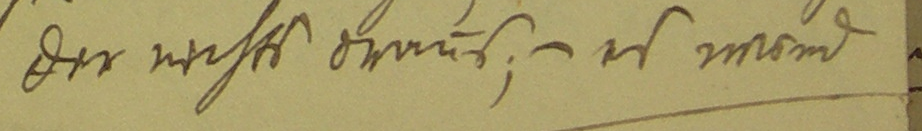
die nicht’s draus, - es wird
